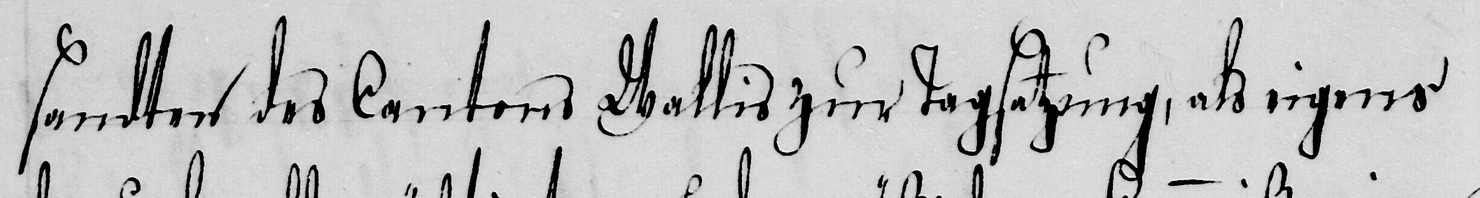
sandten des Cantons Wallis zur Tagsatzung, als eigens
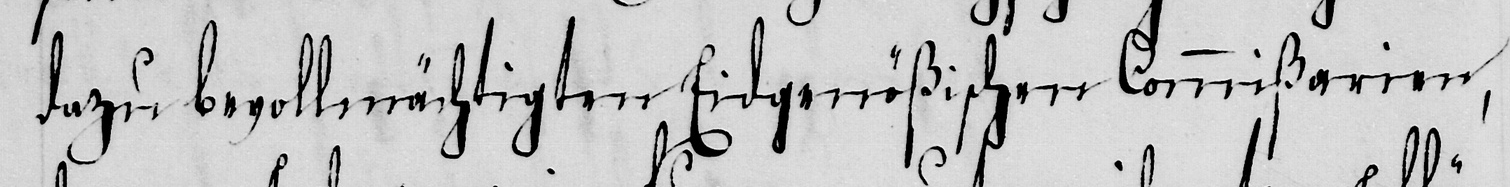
dazu bevollmächtigten Eidgenößischen Commißarien,
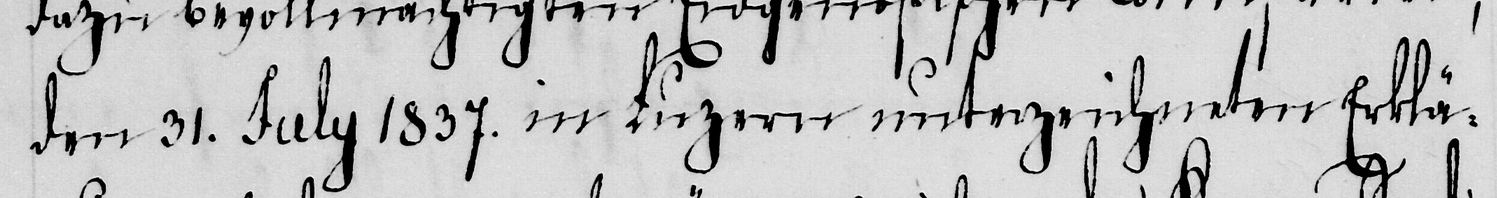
den 31. July 1837. in Luzern unterzeichneten Erklä¬
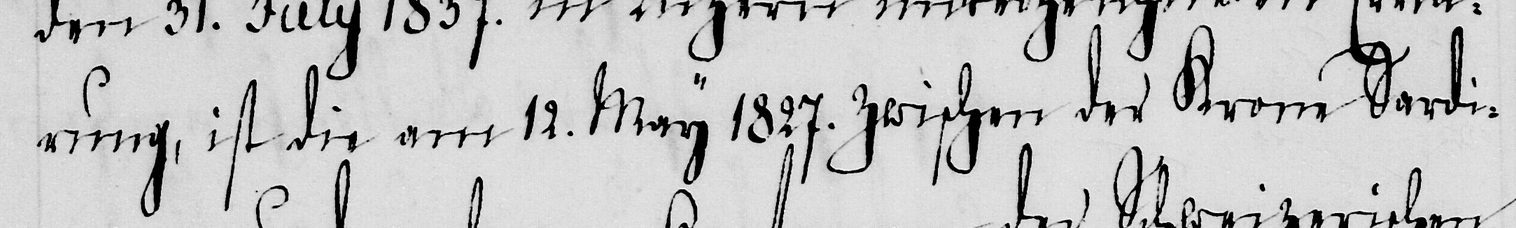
rung, ist die am 12. May 1827. zwischen der Krone Sardi¬
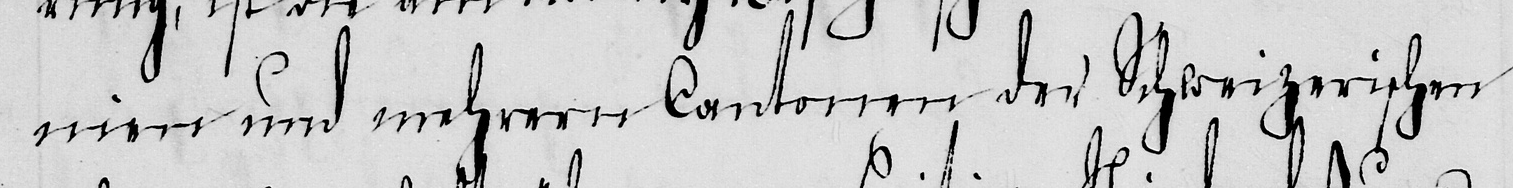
nien und mehrern Cantonen der Schweizerischen
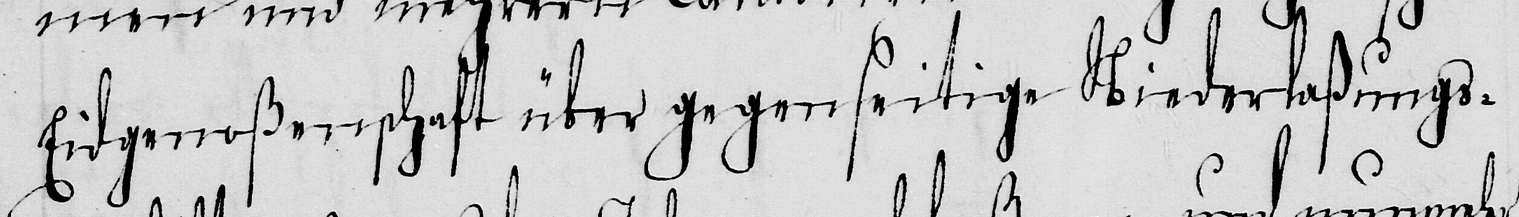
Eidgenoßenschaft über gegenseitige Niederlaßungs¬
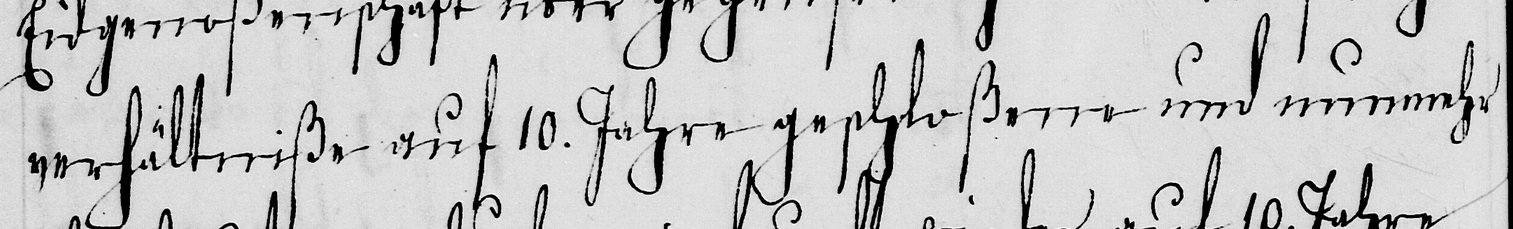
verhältniße auf 10. Jahre geschloßene und nunmehr
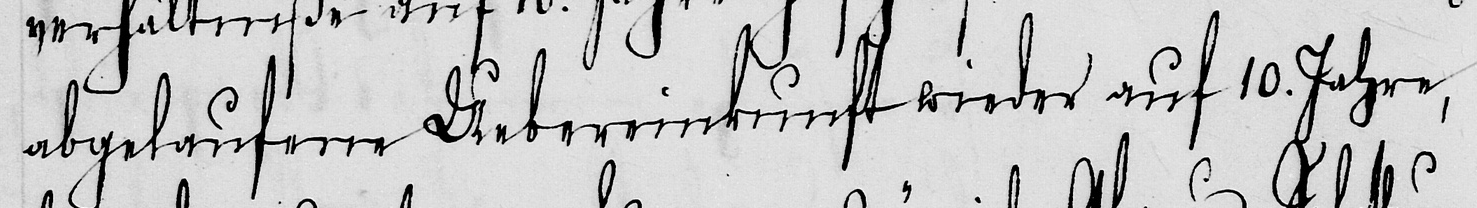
abgelaufene Uebereinkunft wieder auf 10. Jahre,
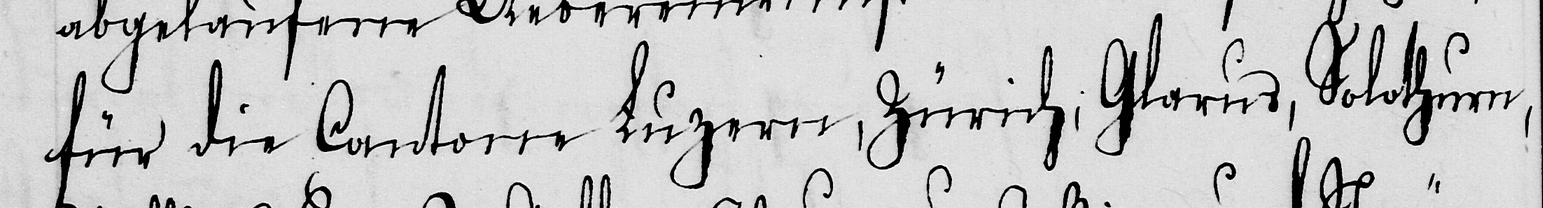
für die Cantone Luzern, Zürich, Glarus, Solothurn,
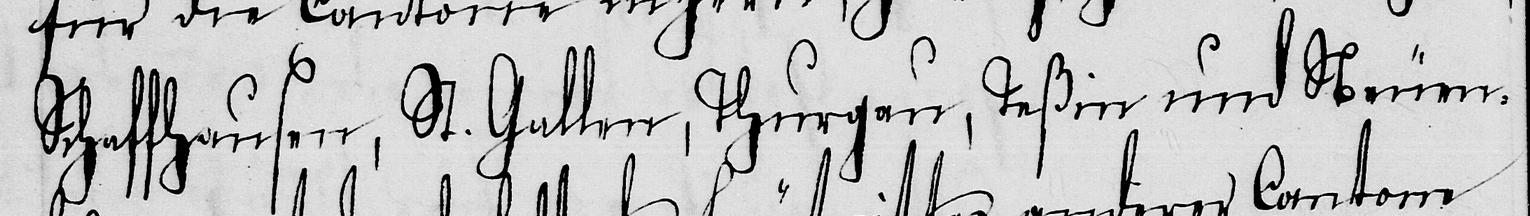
Schaffhausen, St. Gallen, Thurgau, Teßin und Neuen¬
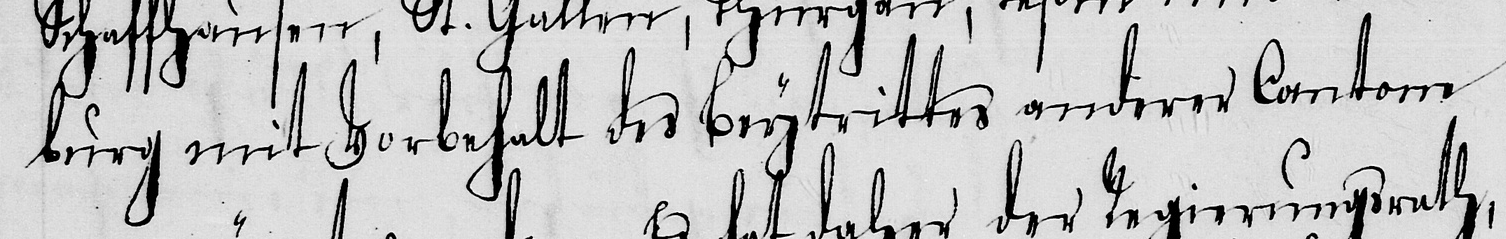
burg mit Vorbehalt des Beytrittes anderer Cantone
